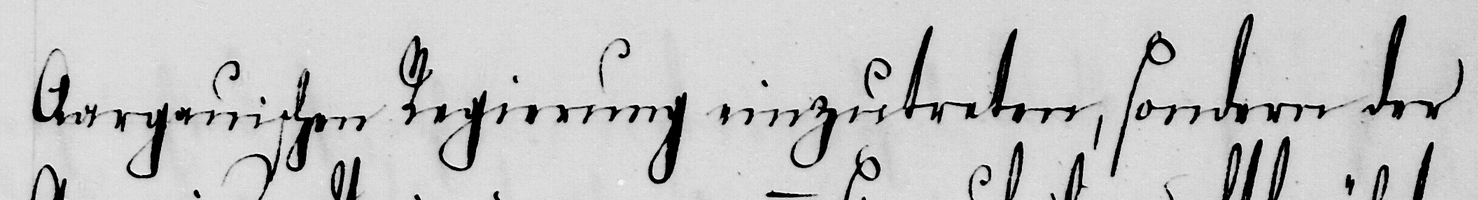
Aargauischen Regierung einzutreten, sondern der
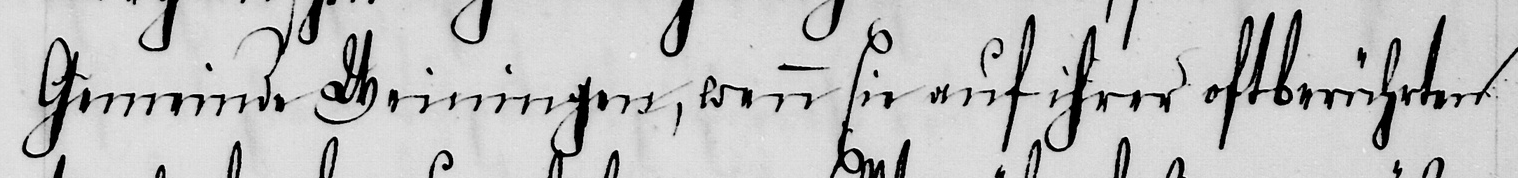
Gemeinde Weiningen, wenn sie auf ihrer oftberührten
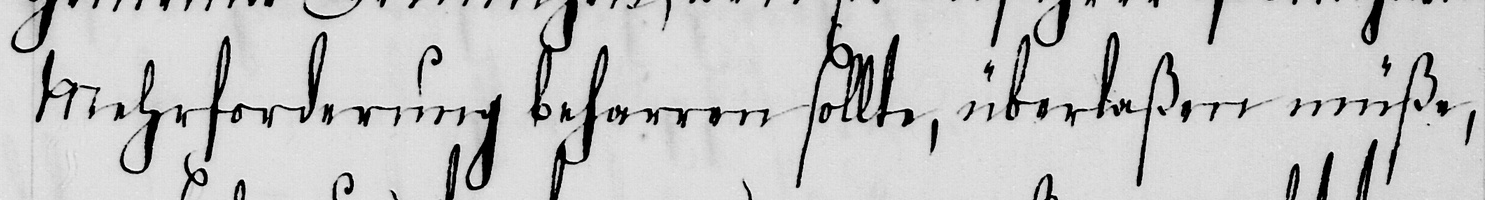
Mehrforderung beharren sollte, überlaßen müße,
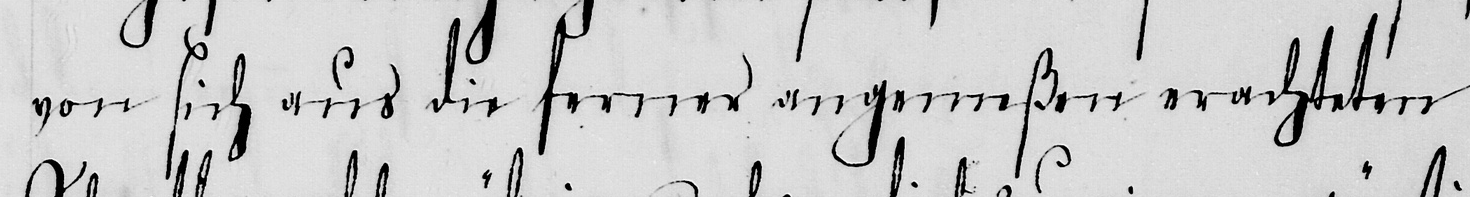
von sich aus die ferner angemeßen erachteten
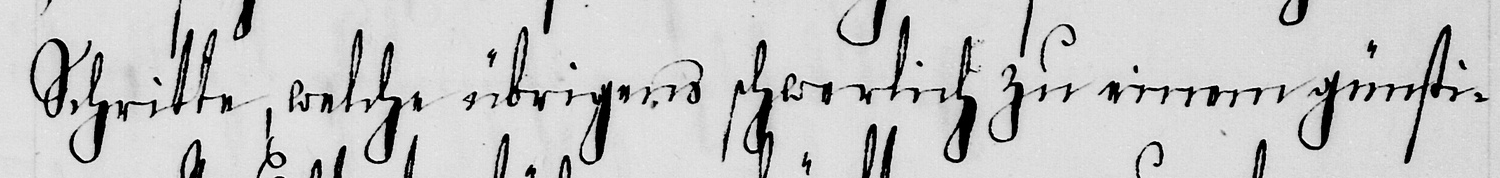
Schritte, welche übrigens schwerlich zu einem günsti¬
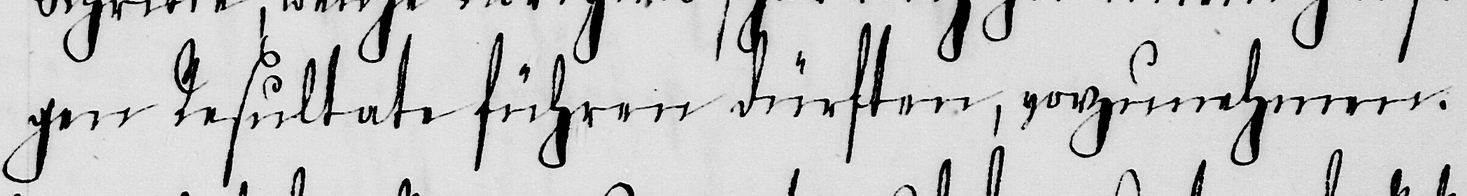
gen Resultate führen dürften, vorzunehmen.
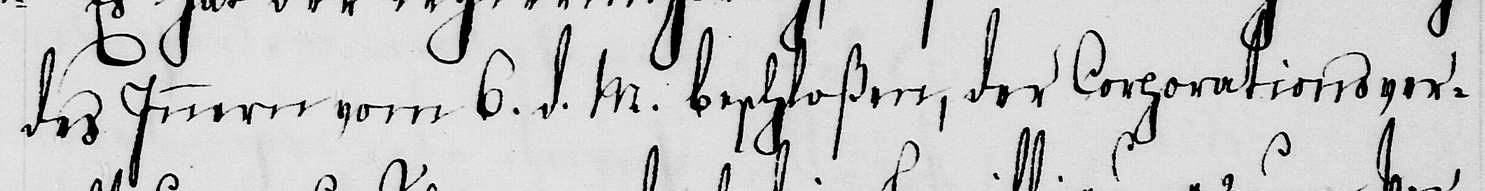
des Innern vom 6. d. M. beschloßen, der Corporationsver¬
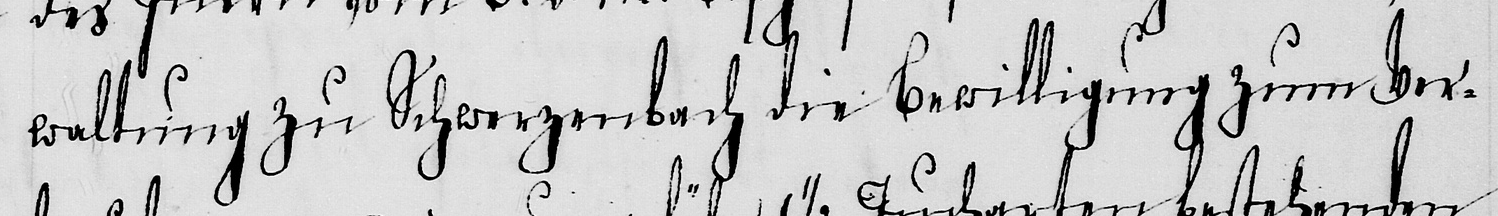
waltung zu Schwerzenbach die Bewilligung zum Ver¬
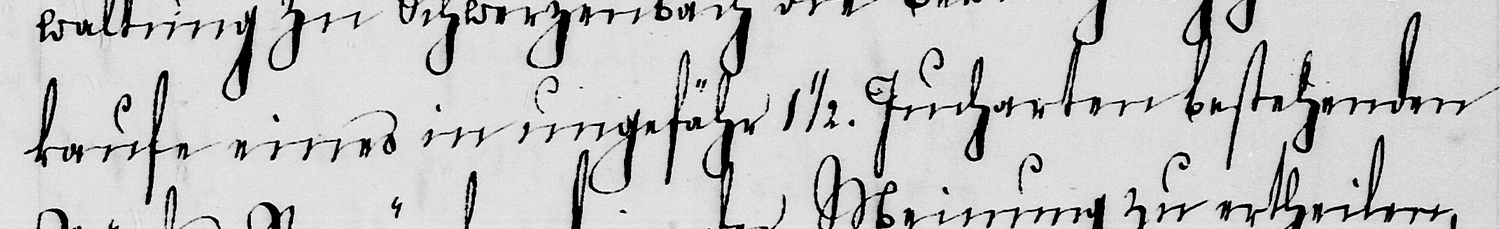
kaufe eines in ungefähr 1 1/2. Juacharten bestehenden
